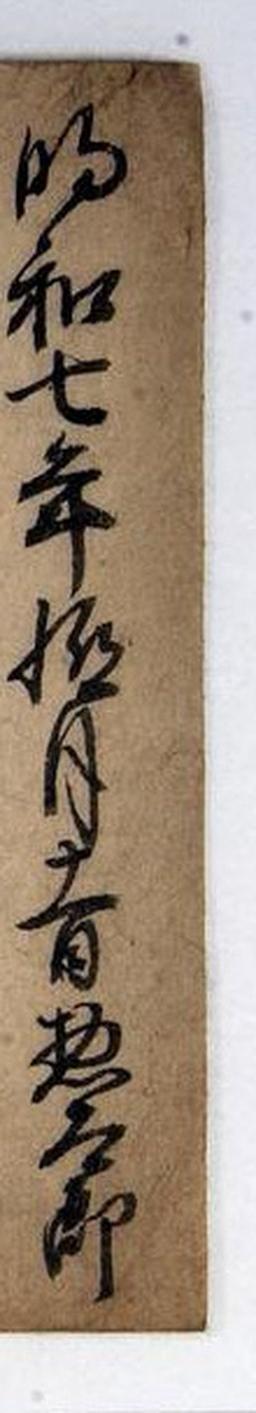明和七年極月十一日惣太郎
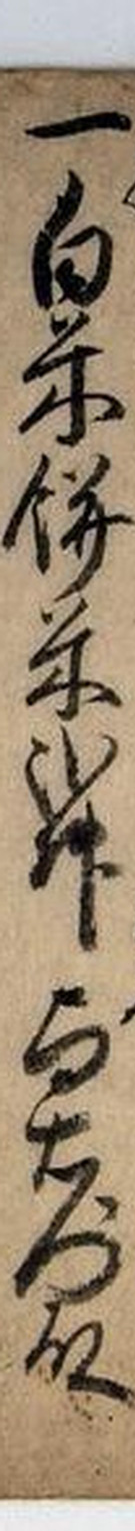一白米餅米弐升与右衛門殿
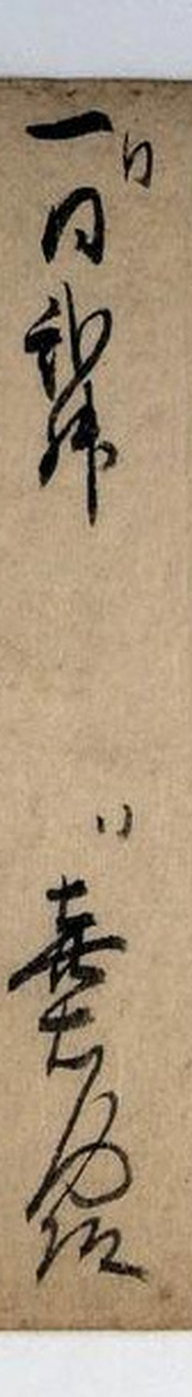一同弐升喜右衛門殿
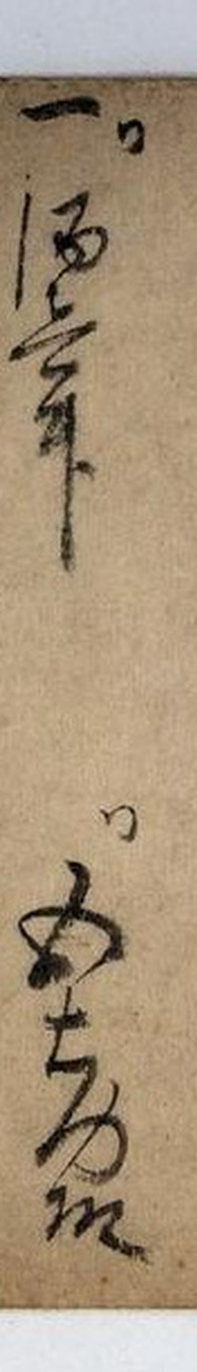一酒壱升五右衛門殿
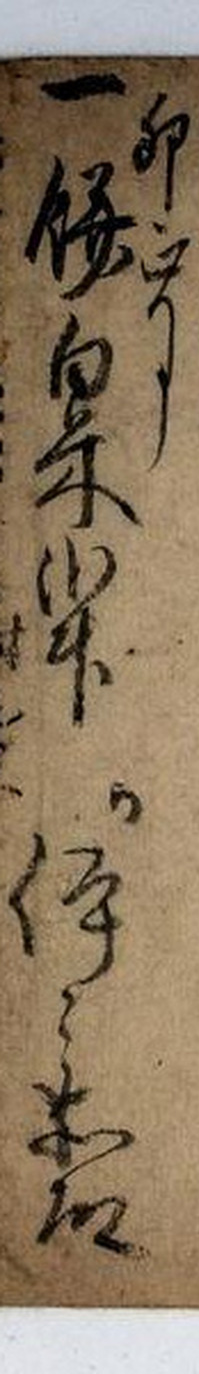一餅白米弐升伊兵衛殿
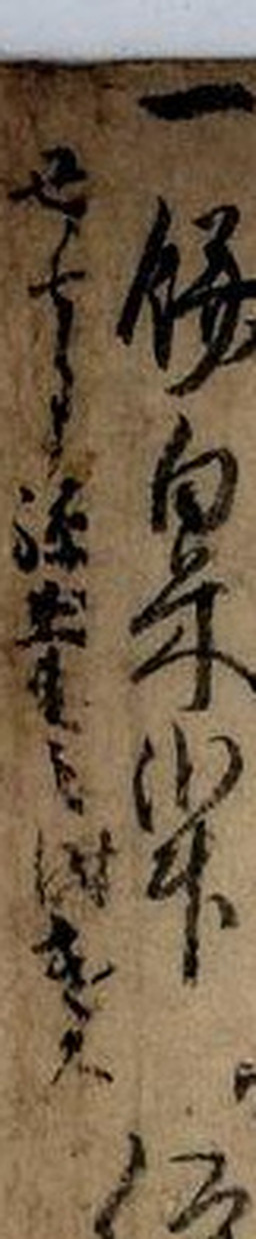丑七月孫出生之時遣ス
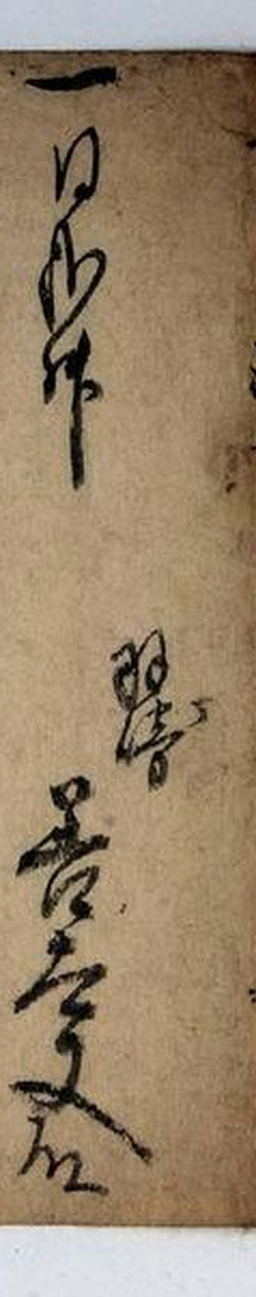一同弐升善太夫殿
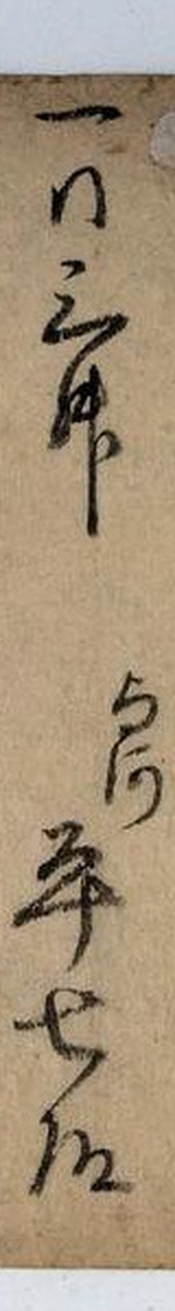一同三升平七殿
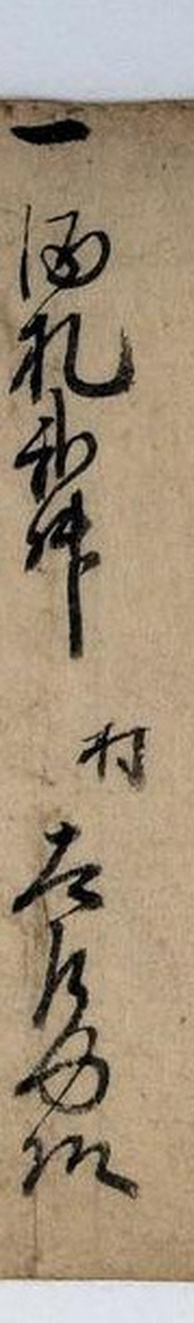一酒札弐升太左衛門殿
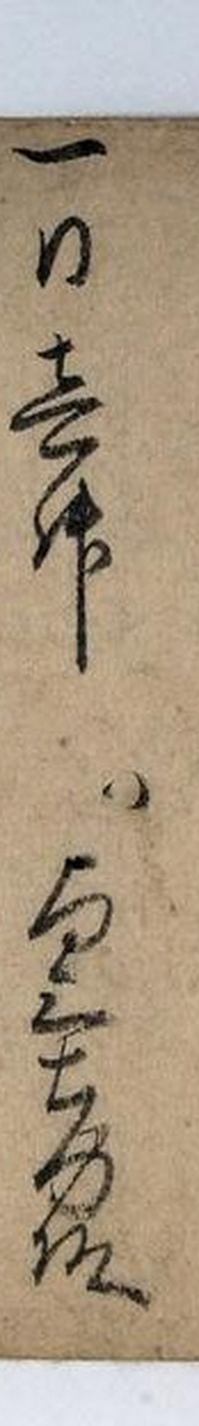一同壱升与三右衛門殿
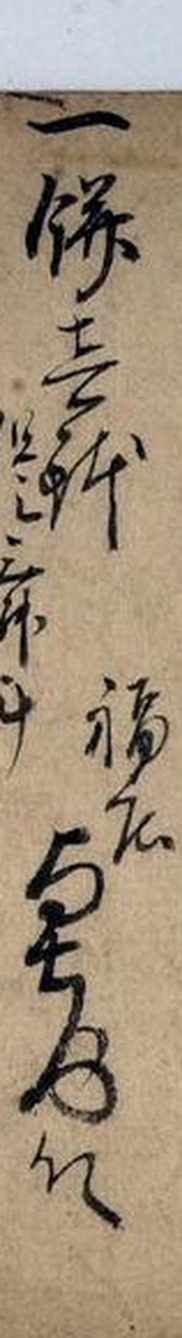一餅壱鉢与右衛門殿
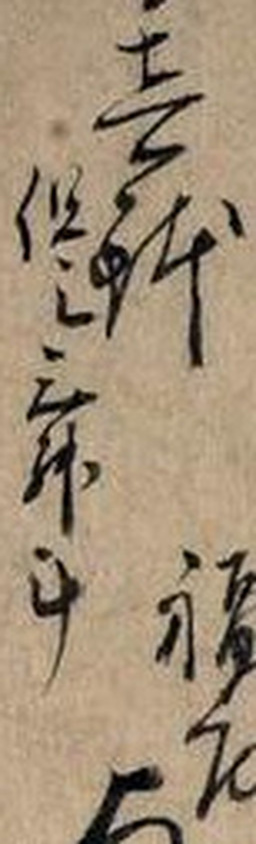但シ三升計
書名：惣太郎出生（右祝）
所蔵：福井県文書館 Fukui Prefectural Archives
